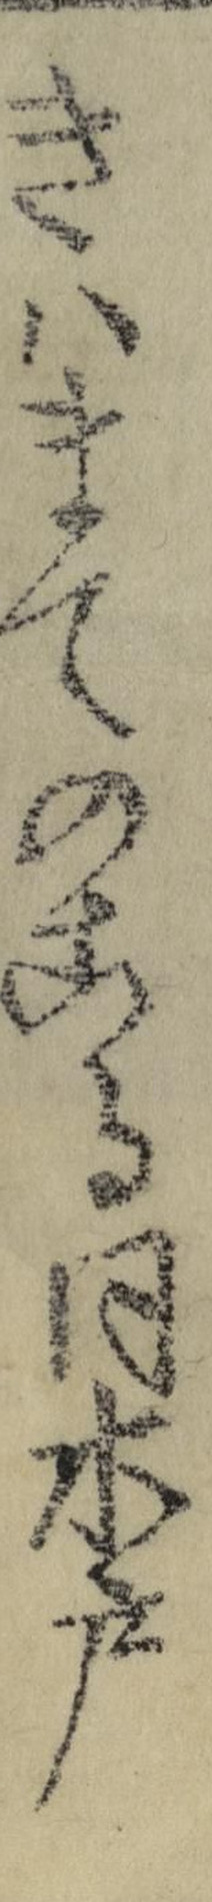きはまてのこる同木戸
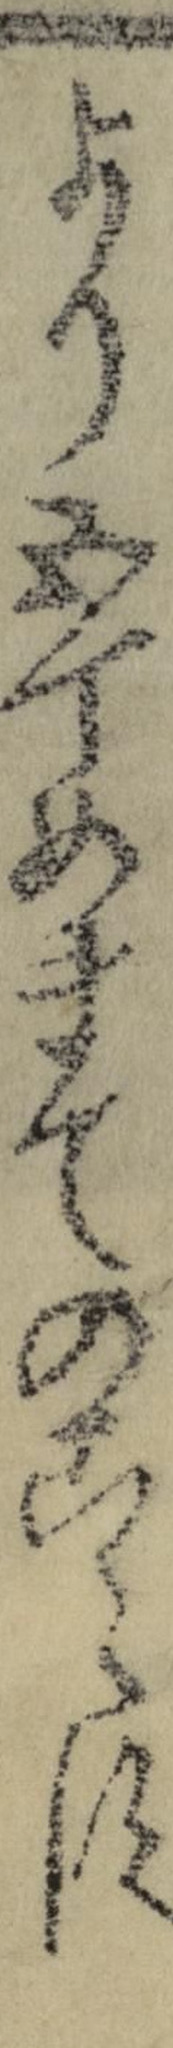より五丁めまてのこらす
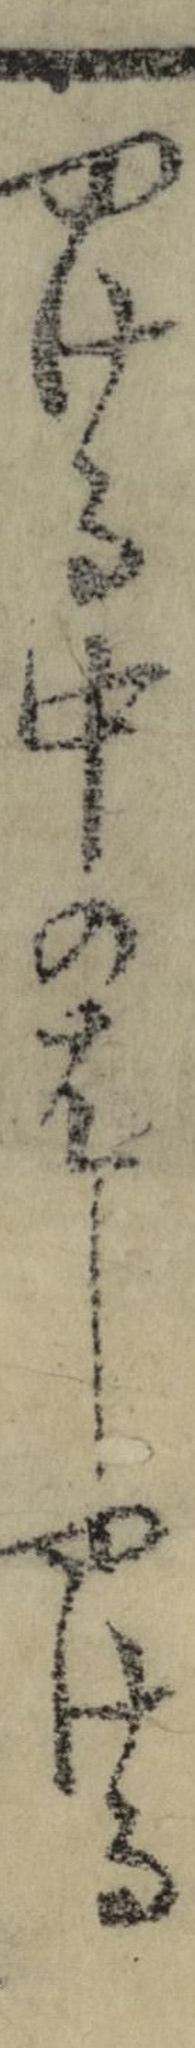やける中のはしやける
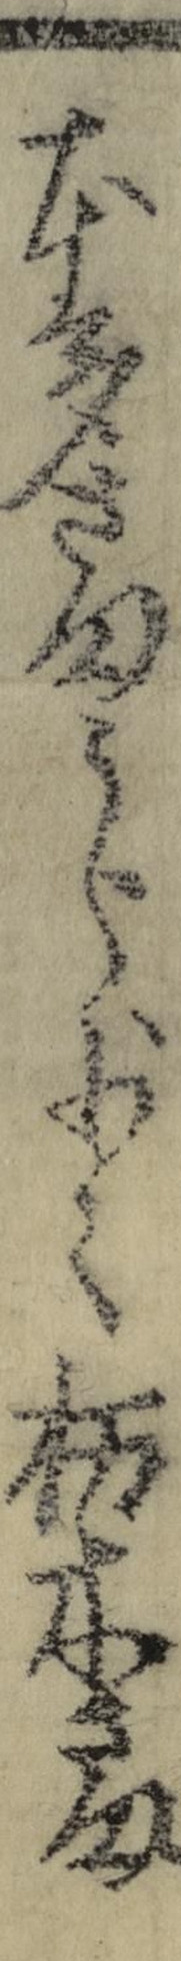本多さまうら少〻朽木さま
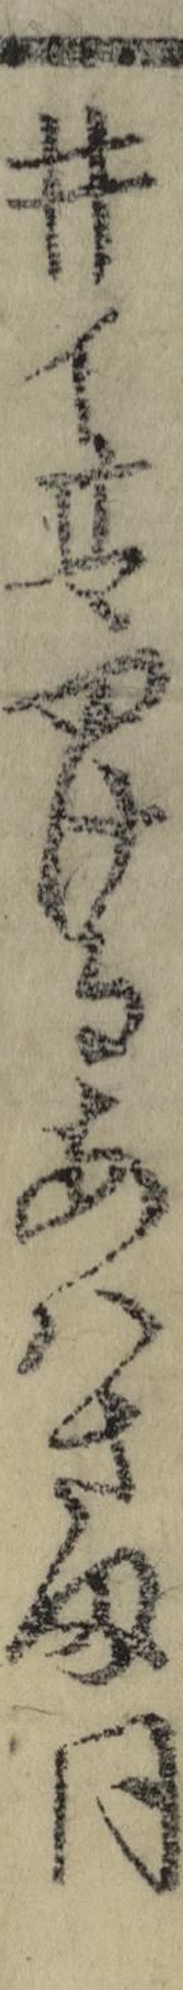井イサマやけるあはさま同
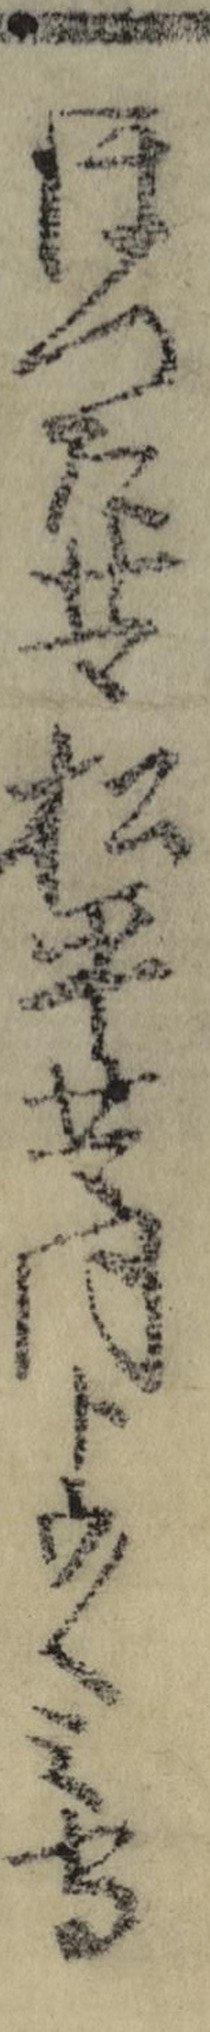ほつたサマ松平サマ同トウ〳〵ミ守
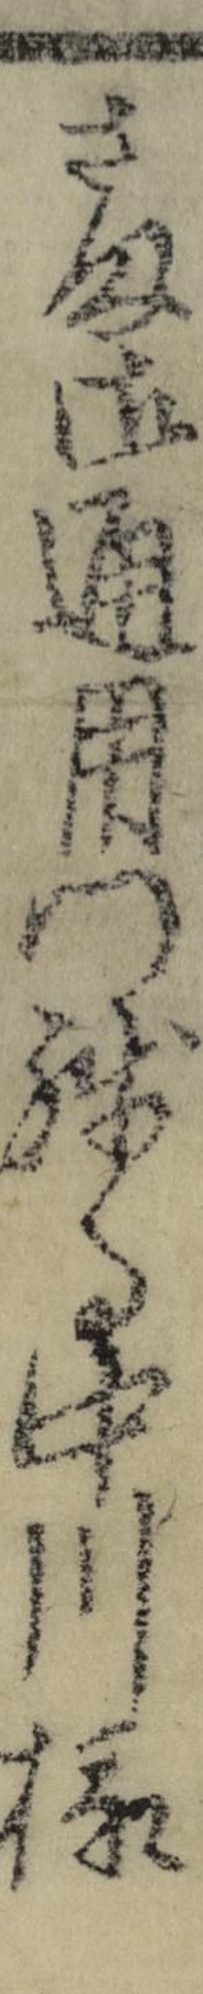さま御通用門残る中川様
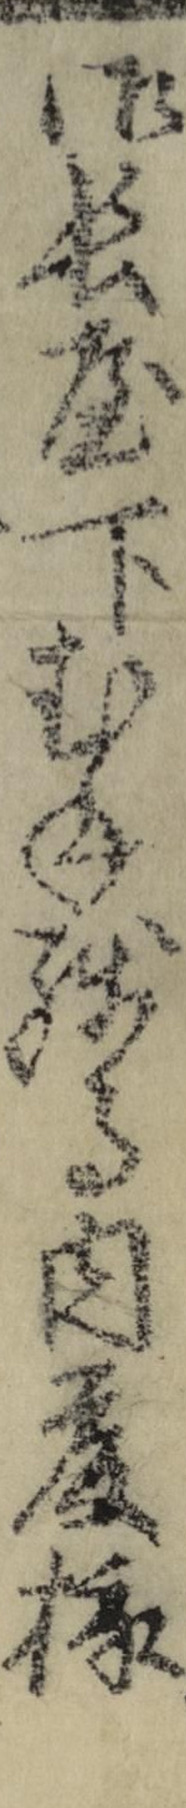御長屋下むね残る内藤様
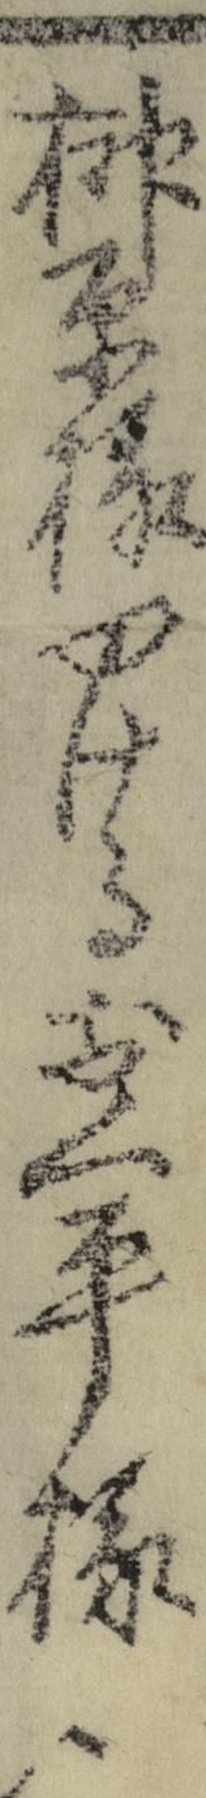榊原様やけるおく平様
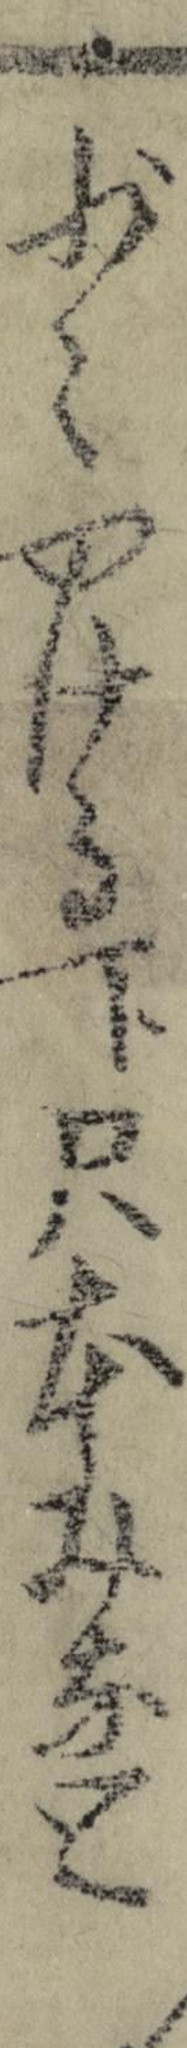少〻やける一ト口ハ本みなと
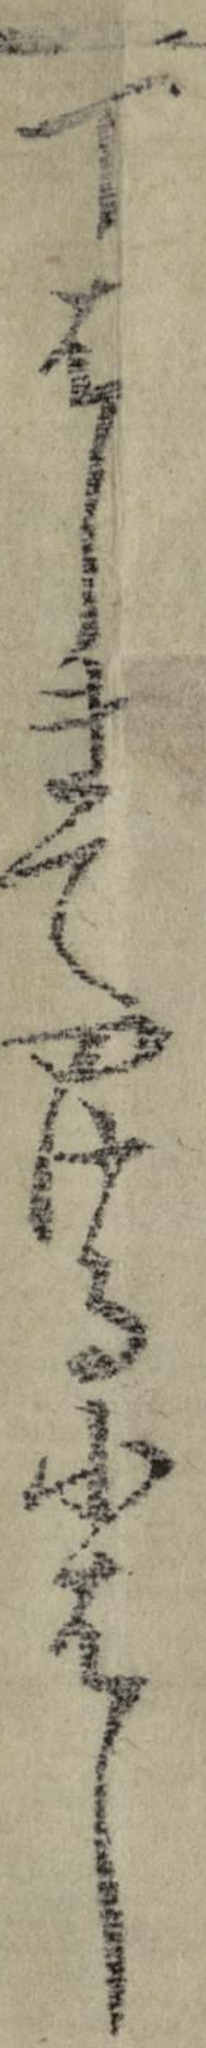丁はしまてやける小はし
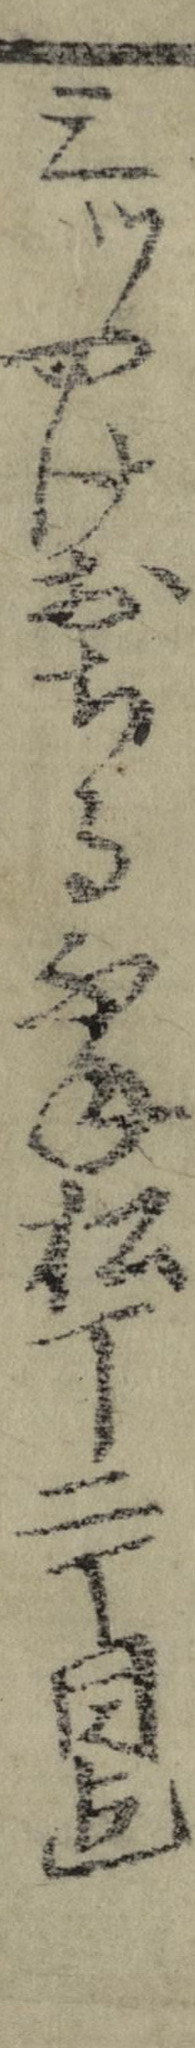三ツやけおちるふね松丁二丁目迄
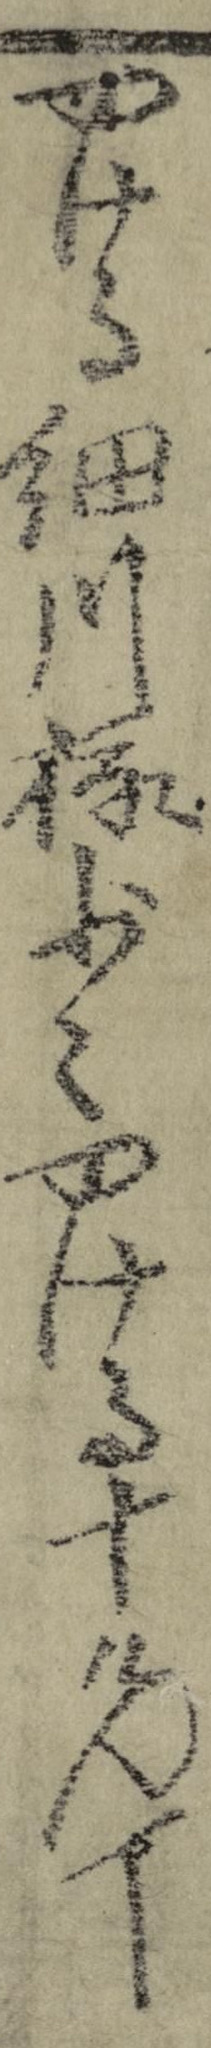やける細川様少〻やける十けん丁
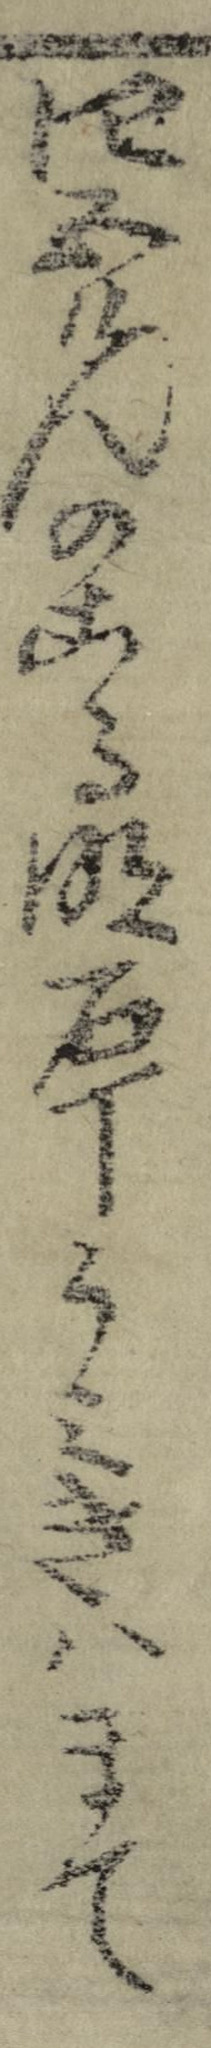四五けんのこる明石丁うみきはまて
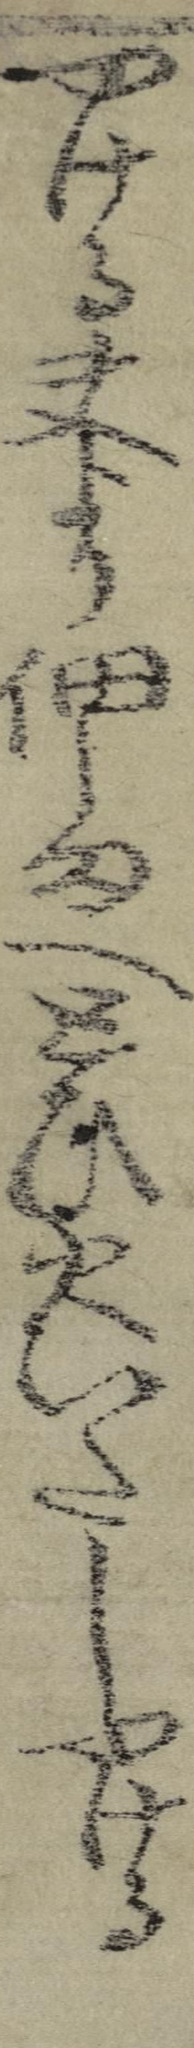やける夫より佃しまへとひ火いたしやける
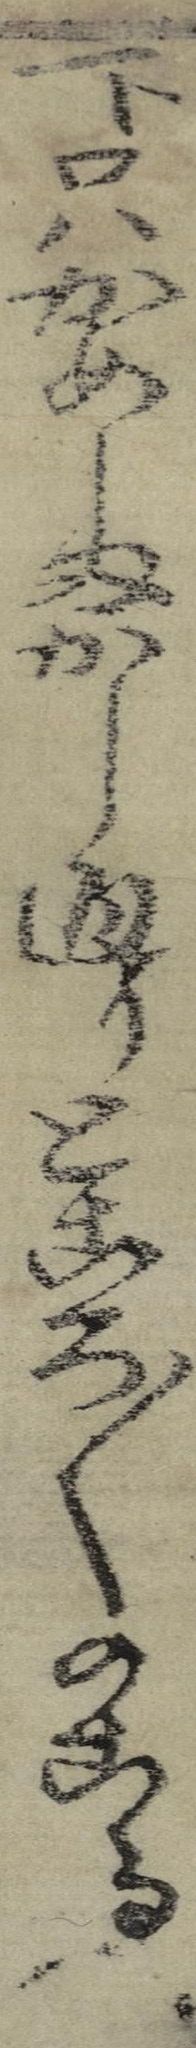一ト口ハかめしまかし通りところ〳〵のこる
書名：[慶応二年十一月の江戸大火に関する瓦版]
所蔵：東京大学地震研究所図書室 Earthquake Research Institute Library, The University of Tokyo, JAPAN
